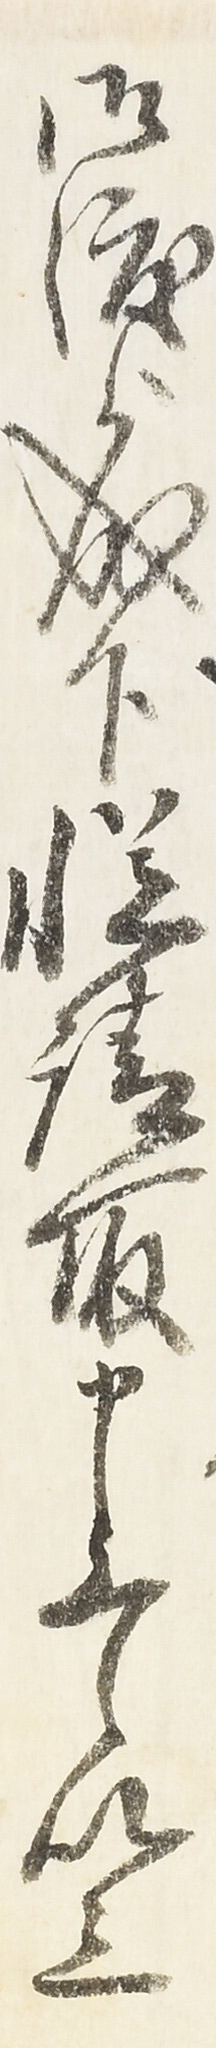御渡被成下慥請取申上候以上
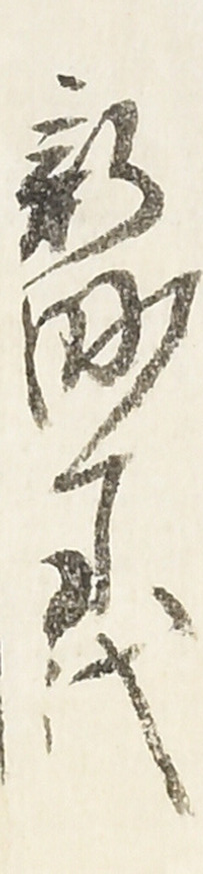新町丁代
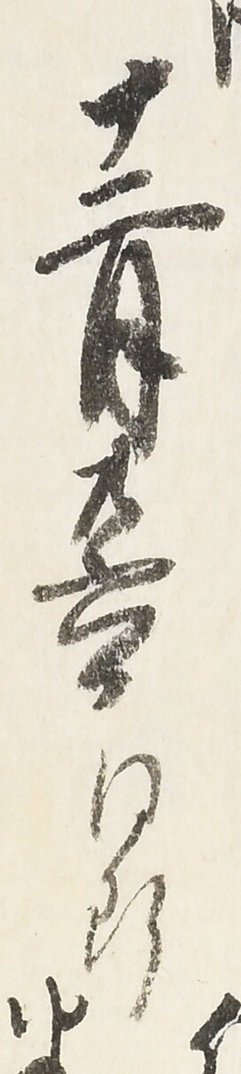十二月廿六日同断
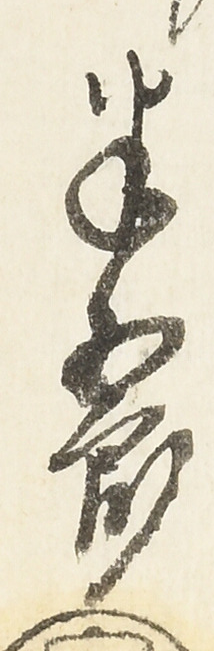半五郎
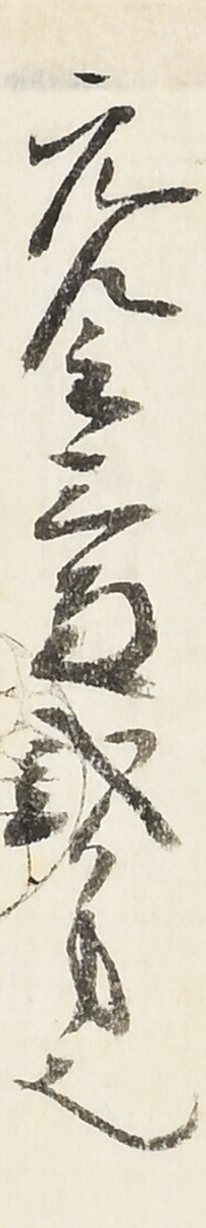元金三両弐分也
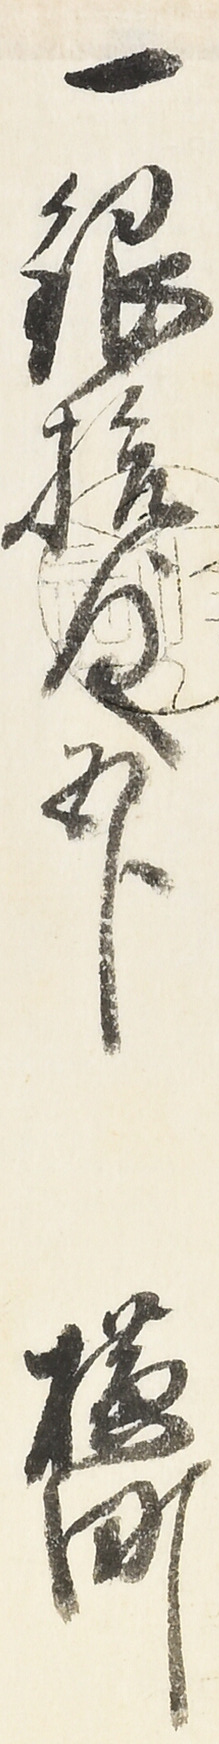一銀拾匁五分横町
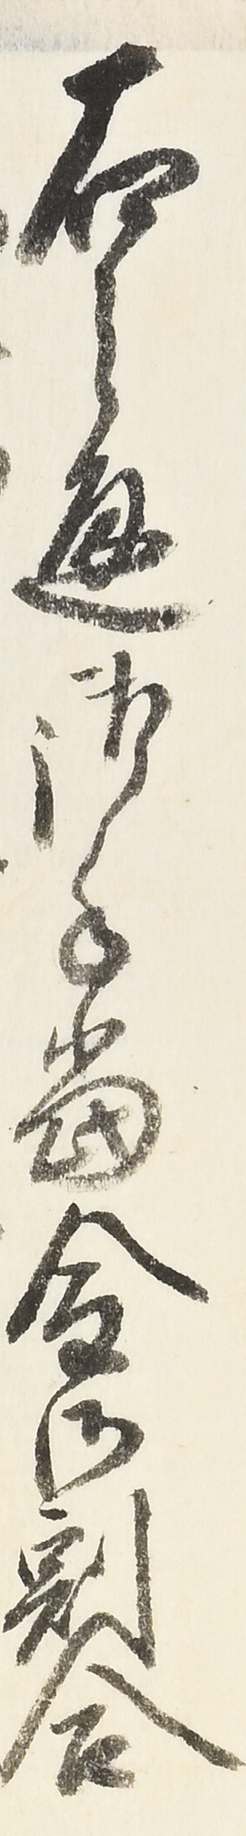右之通御手当金御割合
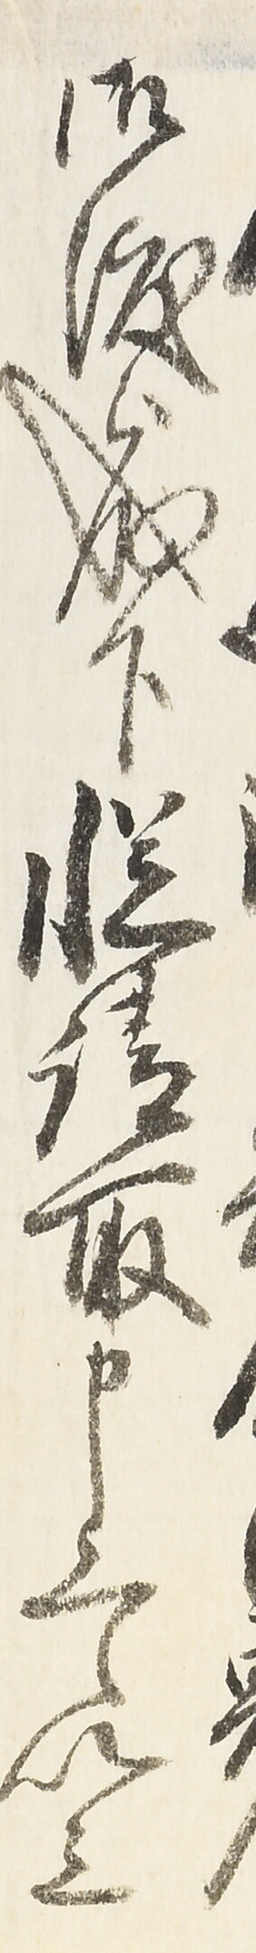御渡被成下慥請取申上候以上
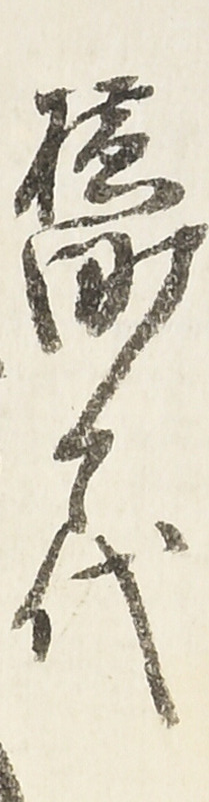横町丁代
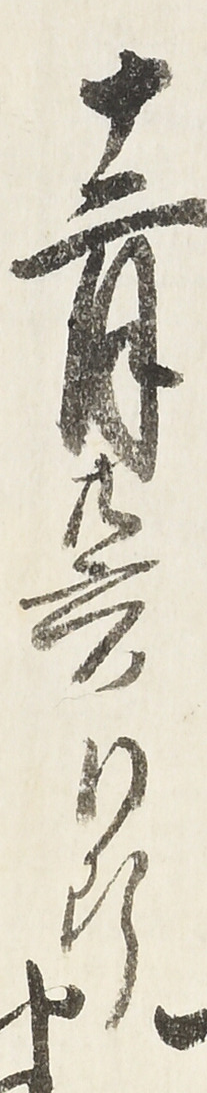十二月廿六日同断
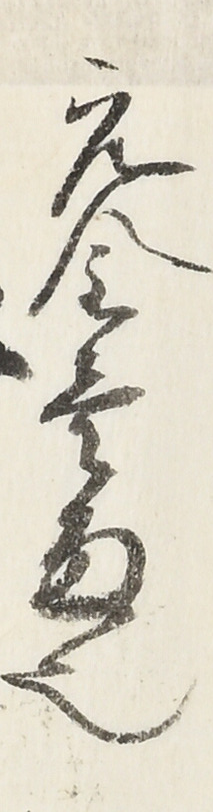一金壱両ト
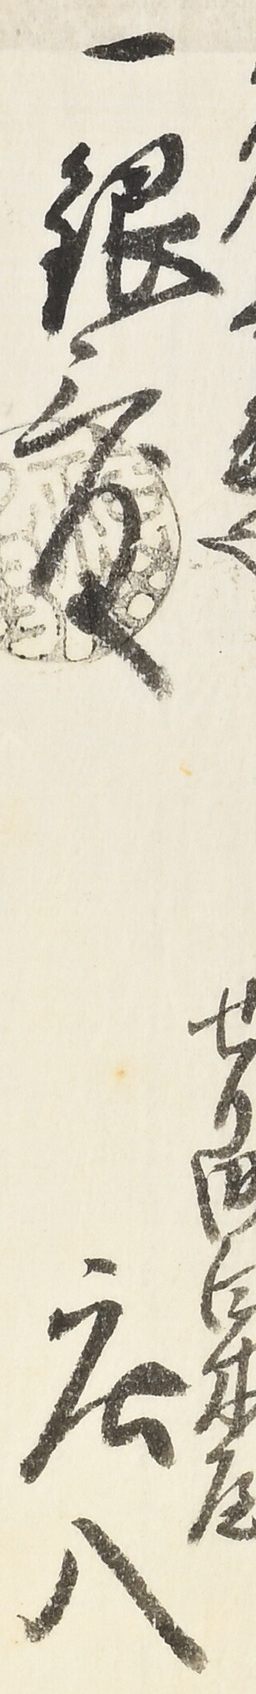一銀三匁庄八
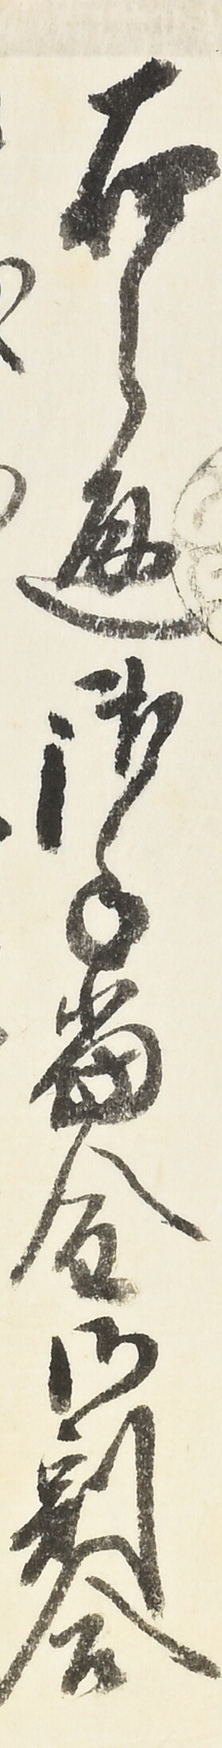右之通御手当金御割合
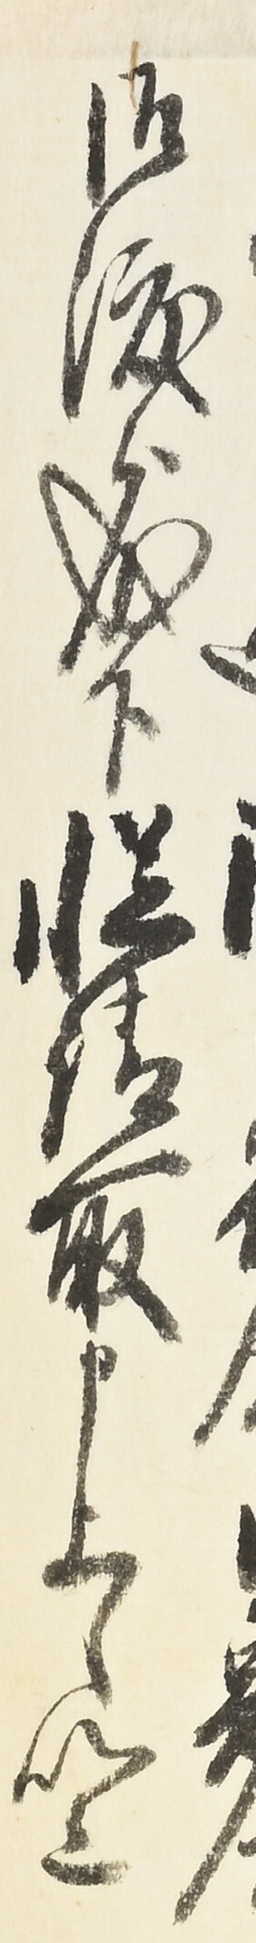御渡被成下慥請取申上候以上
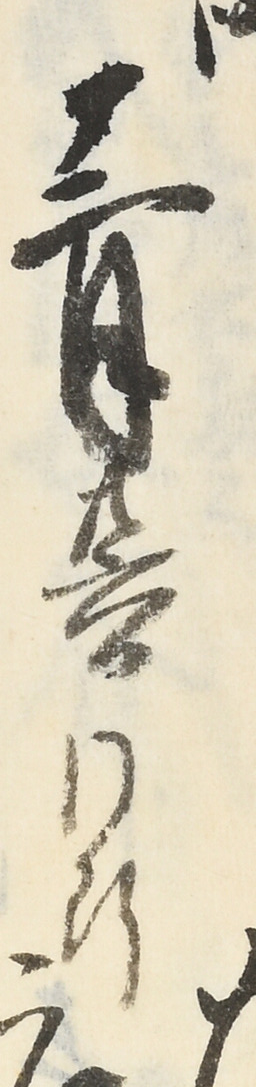十二月廿六日同断

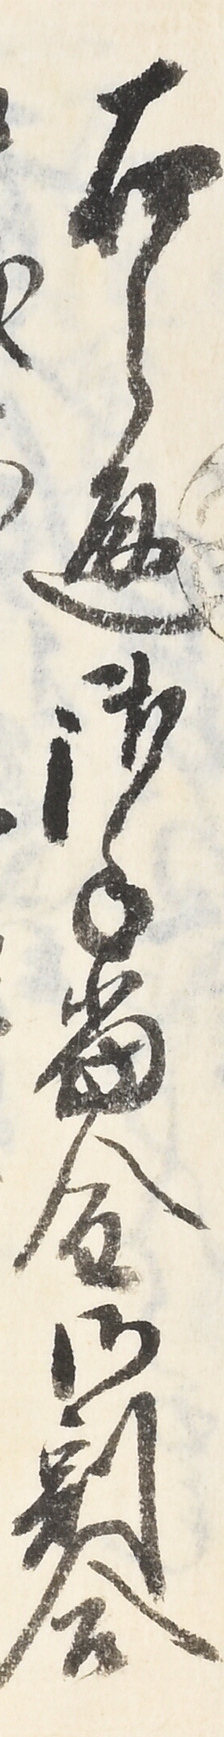右之通御手当金御割合
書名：御才覚金御利足割渡扣帳
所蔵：伊那市立高遠町図書館・合同会社AMANE
